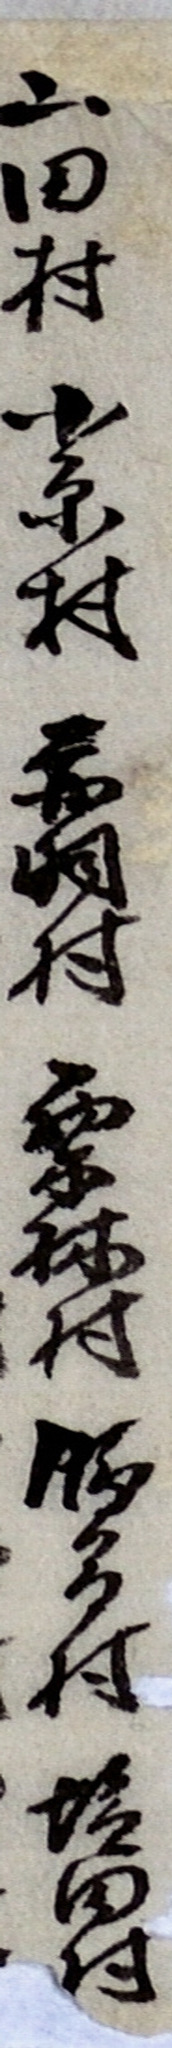山田村北原村赤羽村栗林村勝間村塩田村
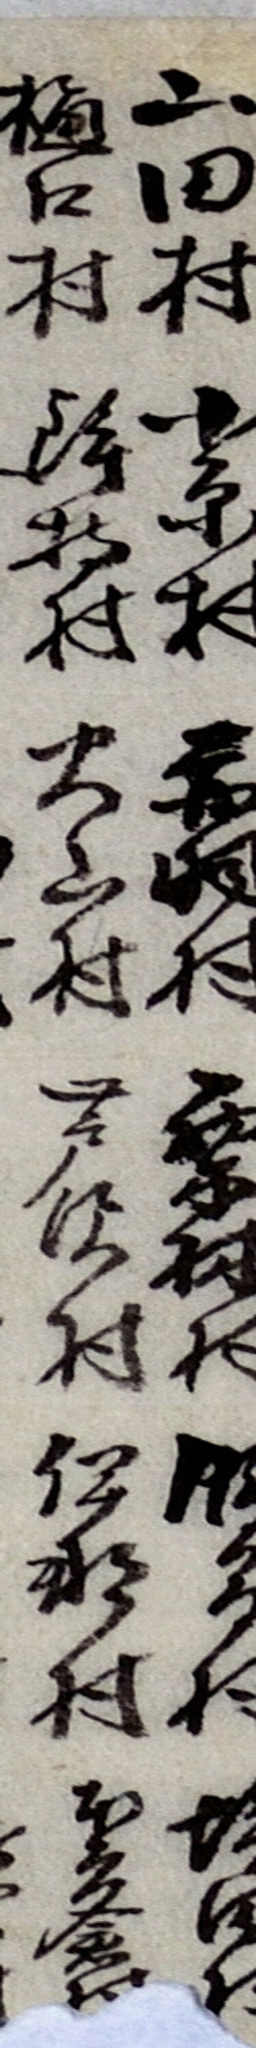樋口村鉾持村火山村芦沢村伊那村本曽倉村
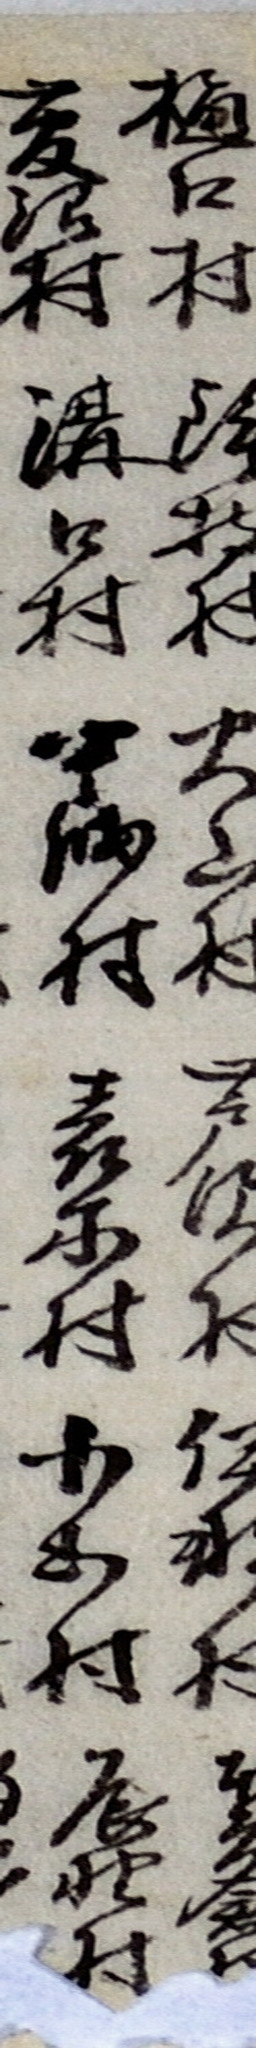菅沼村溝口村中越村表木村小出村辰野村
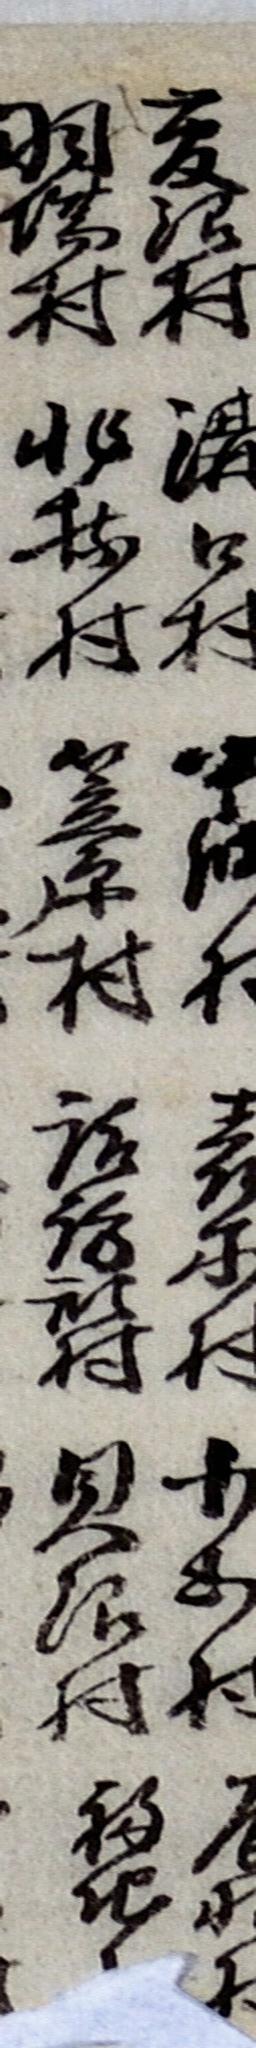羽場村非持村笠原村諏訪形村貝沼村福地村
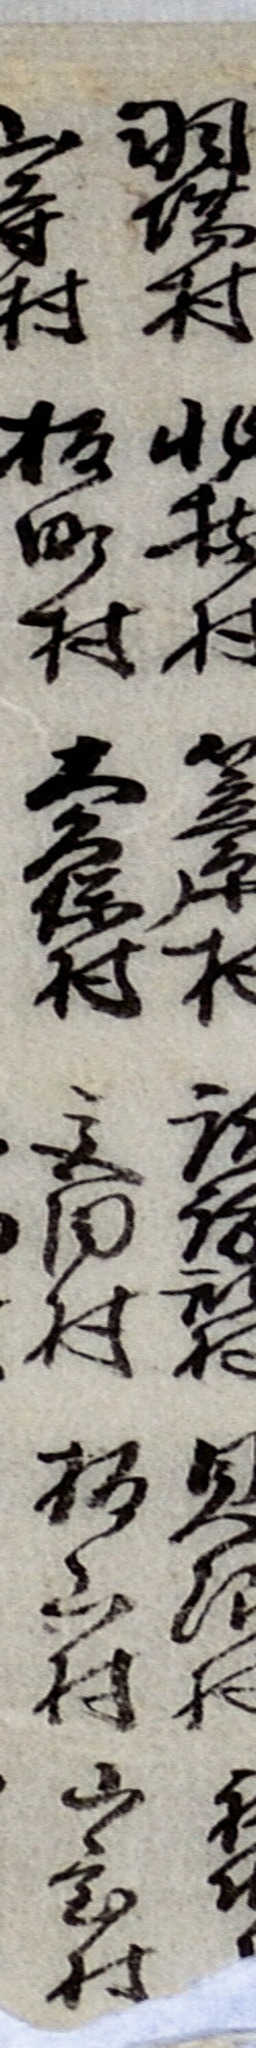山寺村板町村大久保村宮田村板山村山室村
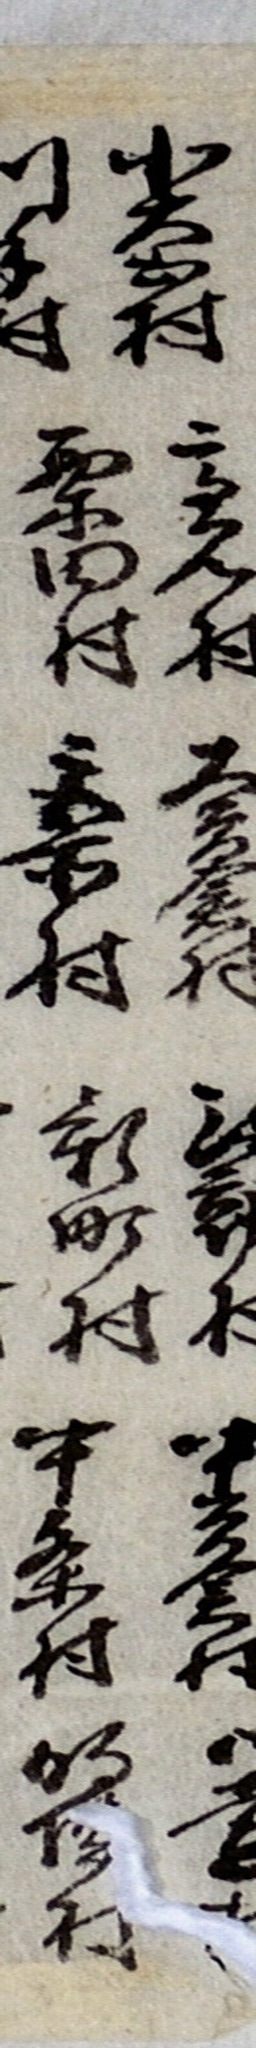川手村栗田村宮所村新町村中条村的場村
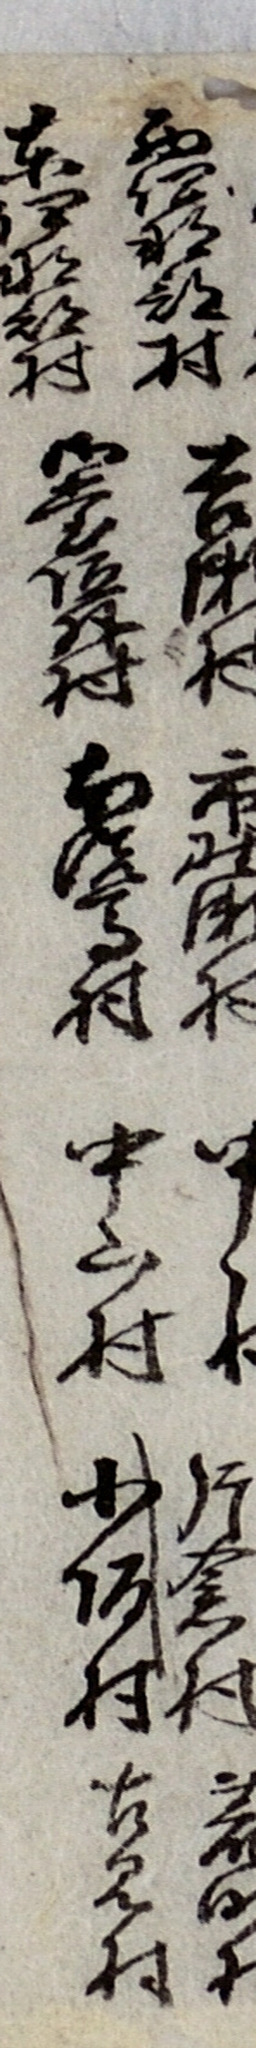東伊那部村御堂垣外村南洗馬村中山村小坂村古見村
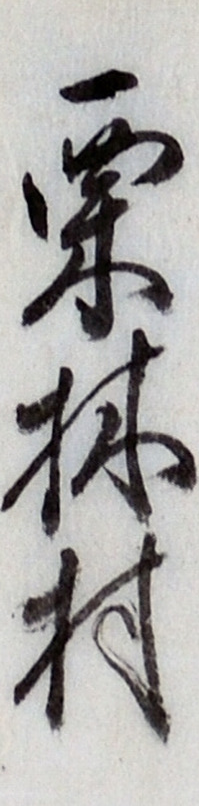栗林村
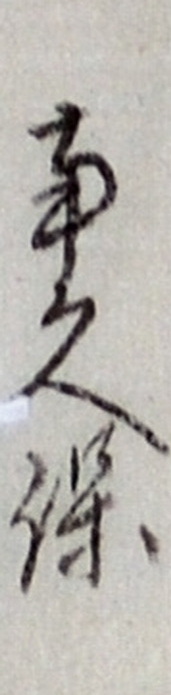南久保
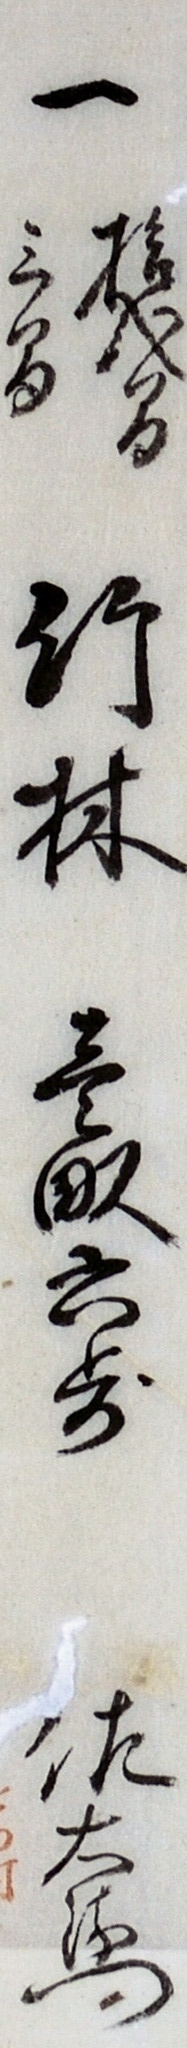一拾弐間竹林壱畝六歩佐太郎
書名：信濃國伊奈筑摩両郡村々官林改帳
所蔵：伊那市立高遠町図書館・合同会社AMANE
